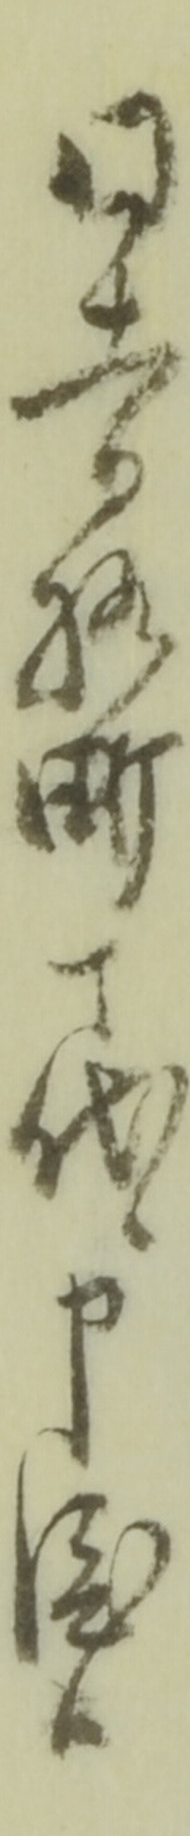同十一日柳町丁代二申渡候

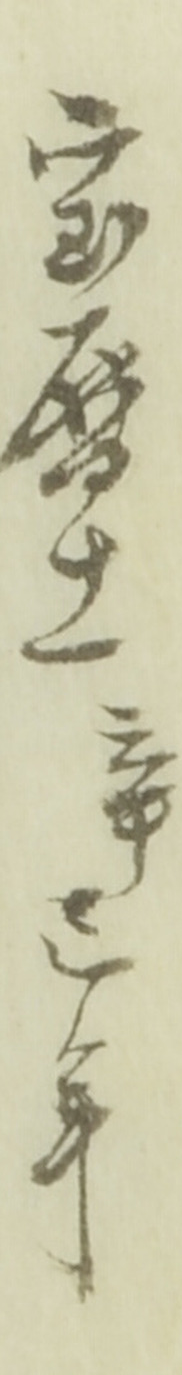宝暦十一年辛己年
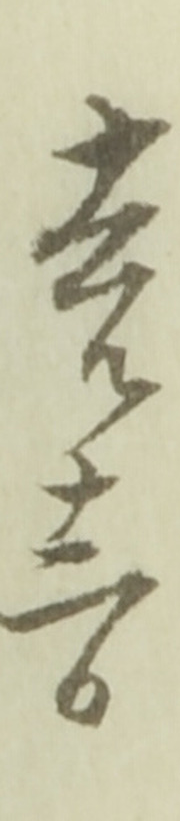去月十二日
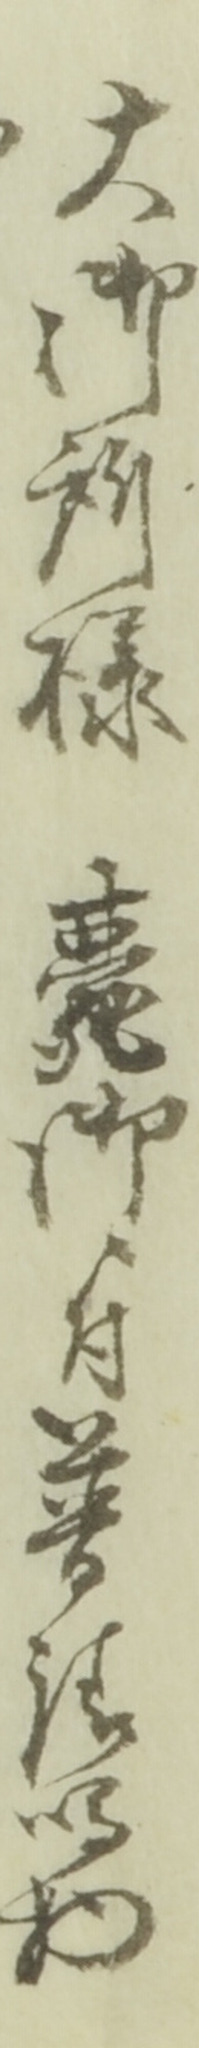大御所様薨御二付普請鳴物
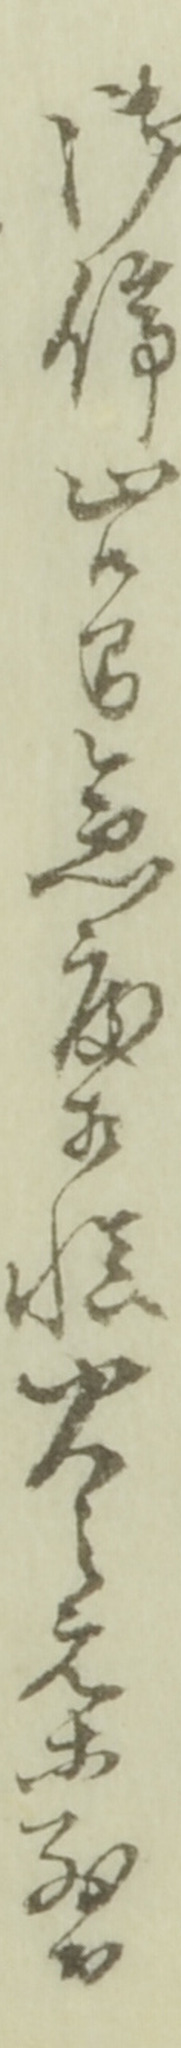御停止候間急度相慎火之元等
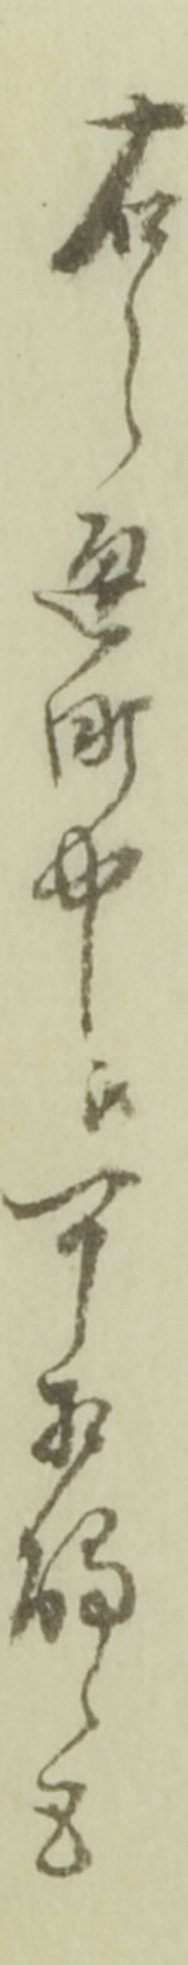右之通町中江可相触候以上
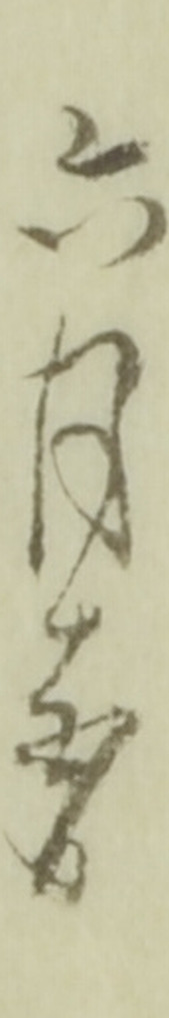六月十五日
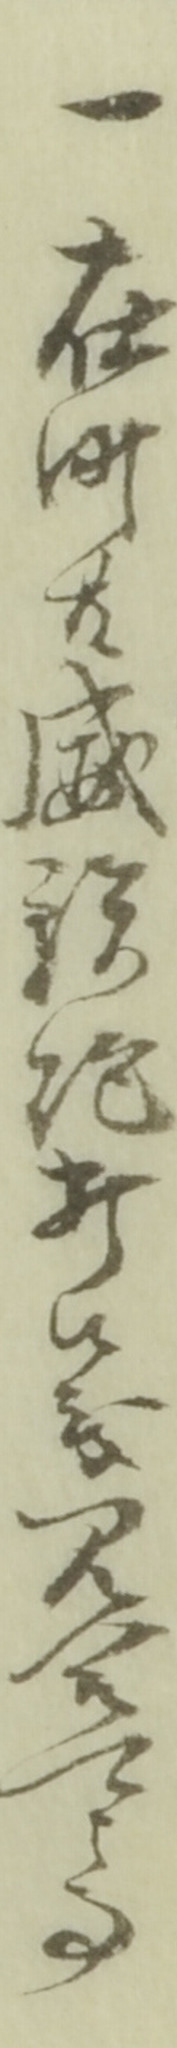一在町共威鉄砲打候義見合可申事
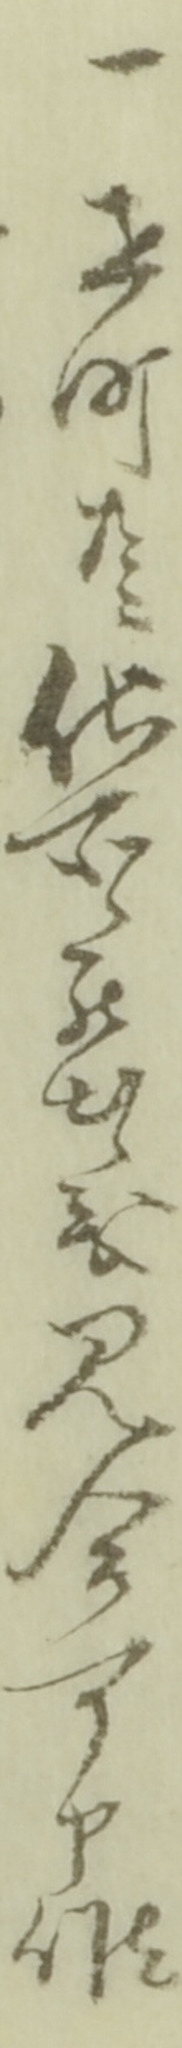一在町共二他所へ罷出候義見合可申候
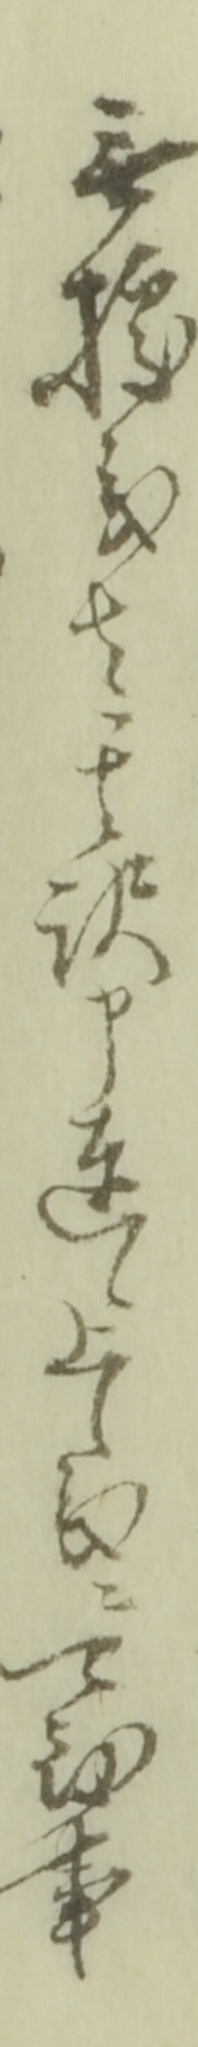無據義者其決申達候上候義二可致事
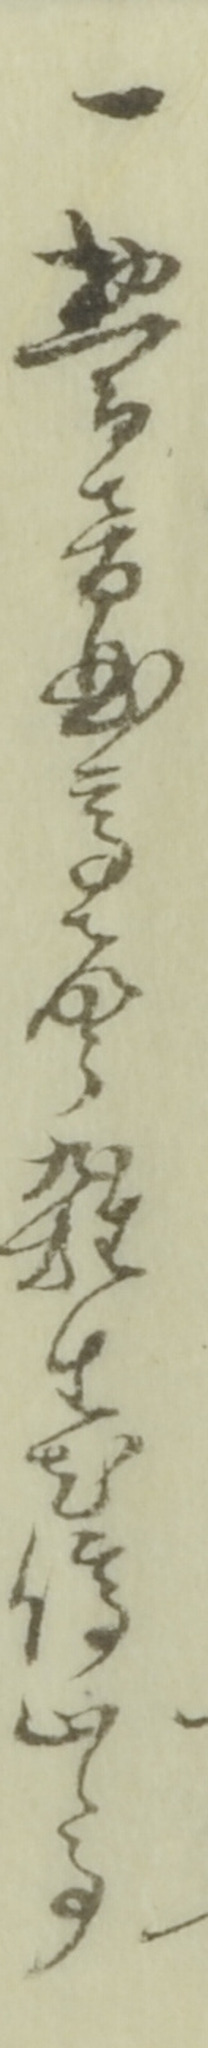一惣而音曲高芸之雑生尤停止候事
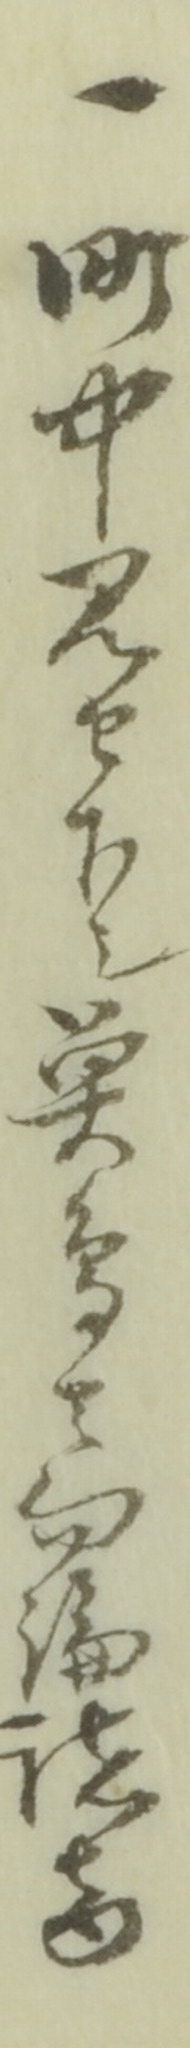一町中見セ下シ巣鳥者勿論所商
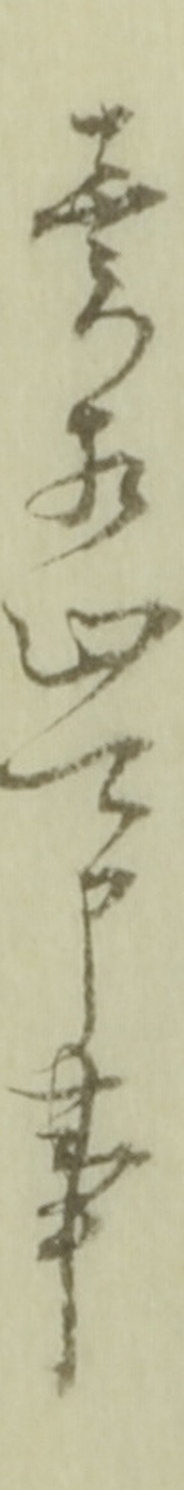売相止可申事
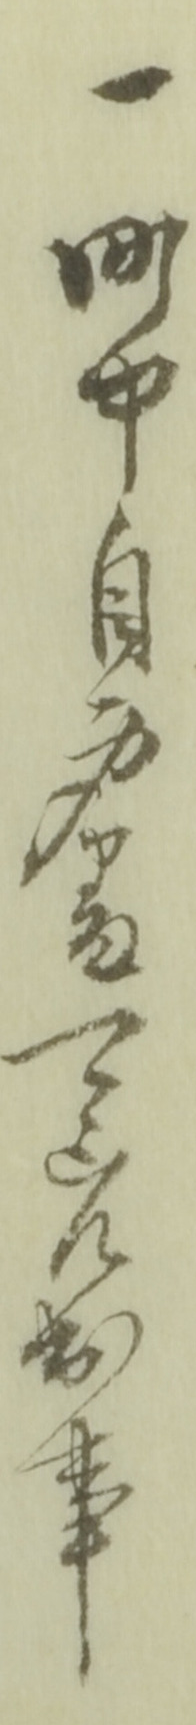一町中自身番可差出事
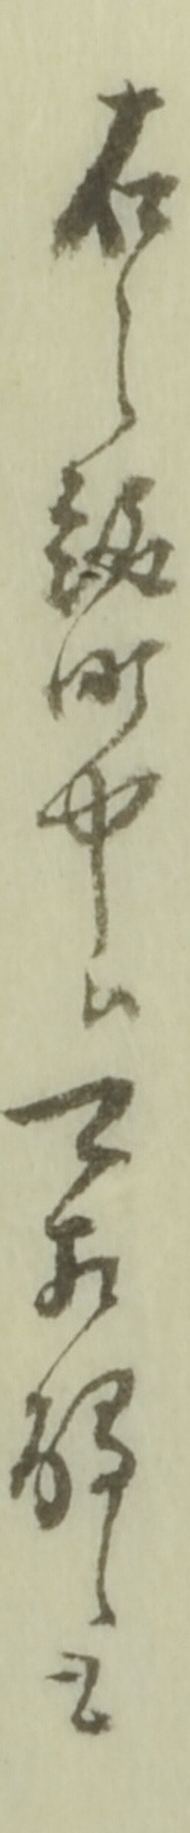右之趣町中え可相触候以上
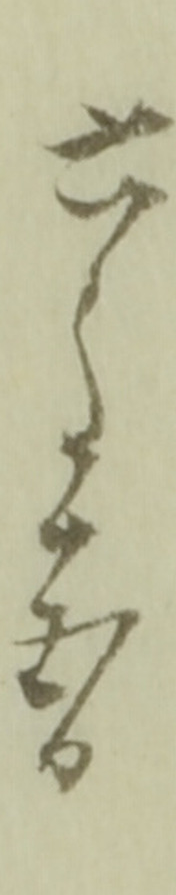六月十五日
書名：御公儀様御領主様御触書控
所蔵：伊那市立高遠町図書館・合同会社AMANE
